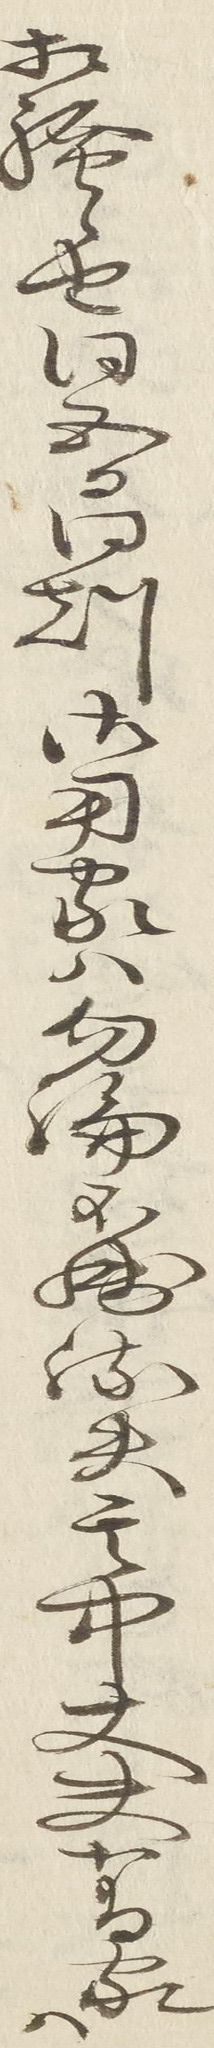相騒之由同五日同刻御用家は勿論不残流失其の中丈夫なる家は
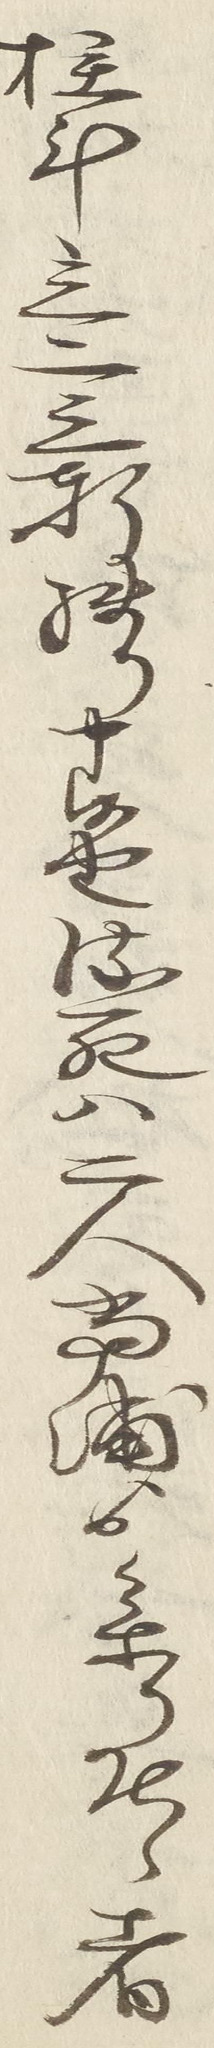柱斗立二三軒残り申候由流死は二人当浦ゟ参り居候者
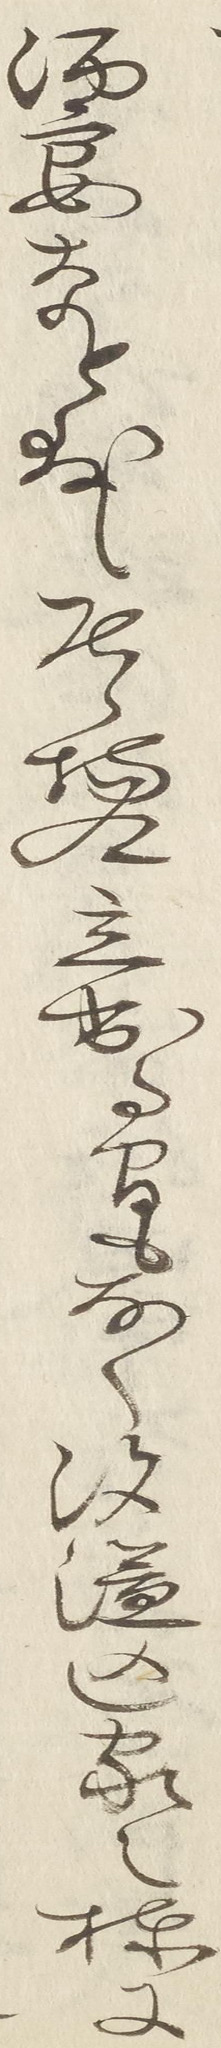酒宴なと致し居候場合立出る間もなく汐溢込家の棟に
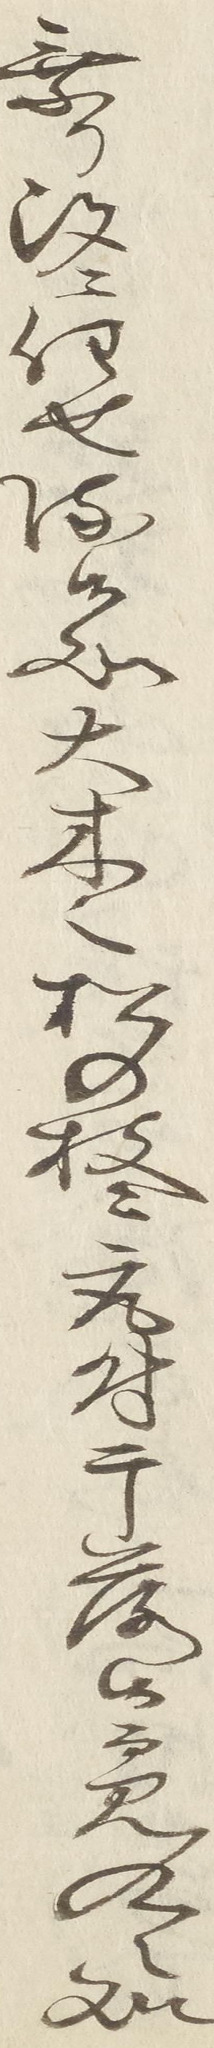乗り汐に任せ流候処大木之松の枝に取付て落候而見合之処
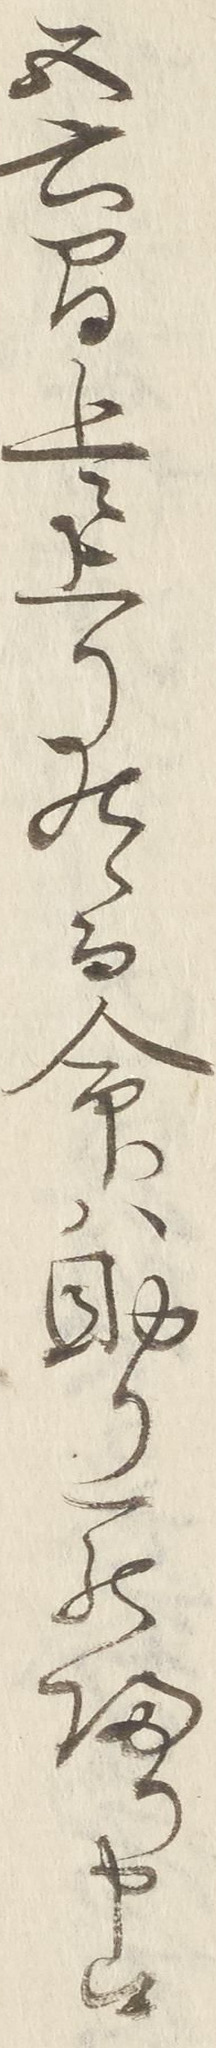五六間上に上り居候而命は助罷帰り申候
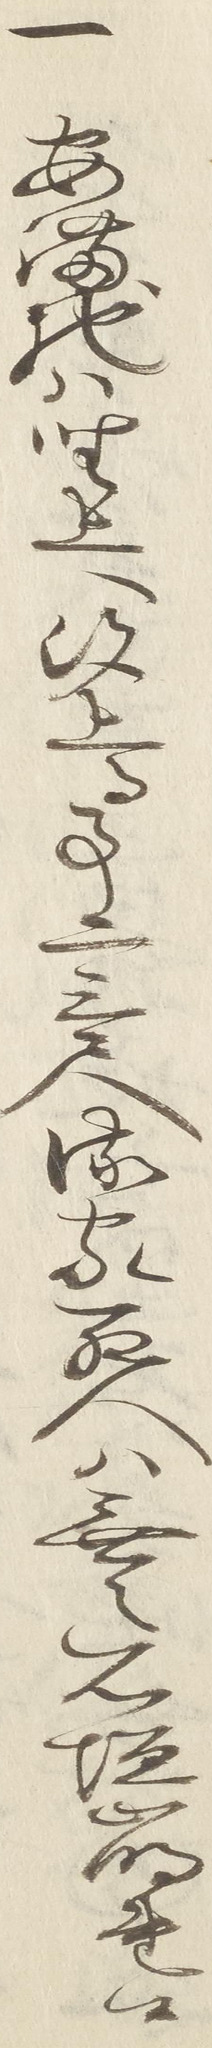一安満地は座上へ汐上る事二三尺流家死人は無之石垣崩れ候
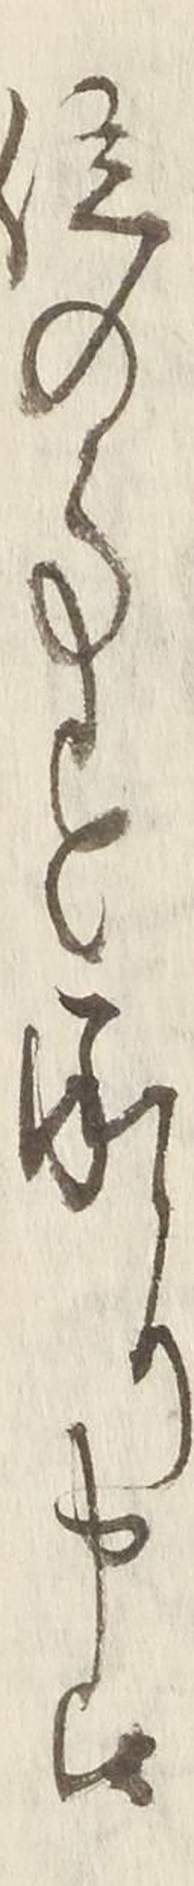位の事と承り申候
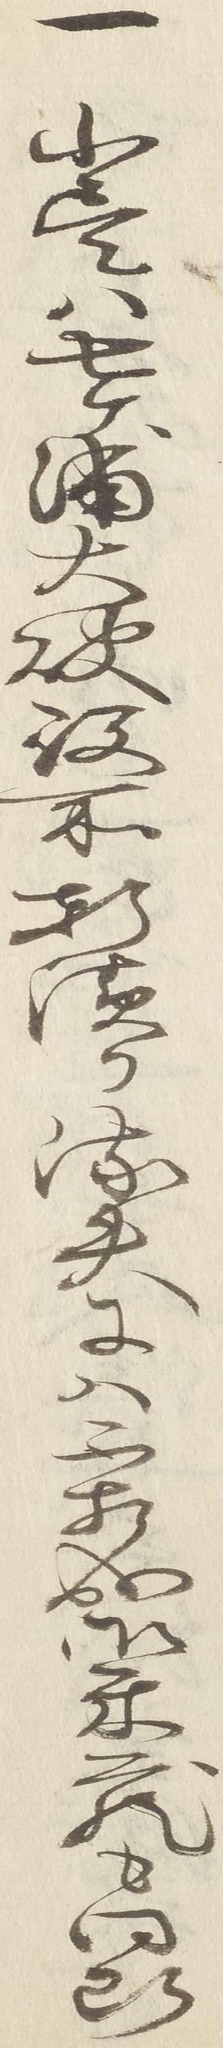一小尽は七ヶ浦大破役所軒漬り流失には不相成御米蔵も同断
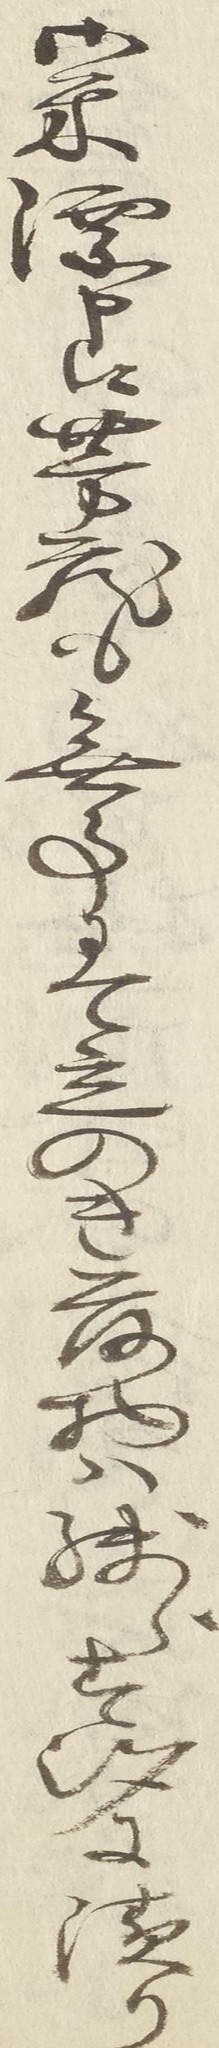御米漂申候芳蔵も無事にて立のき荷物は残らず汐に漬り
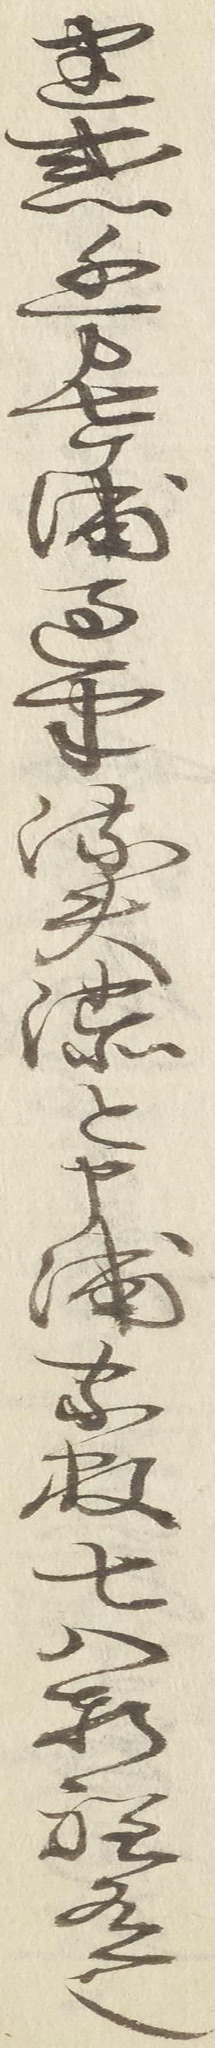迷惑千万七ヶ浦過半流失湊と申浦家数七八軒程有之
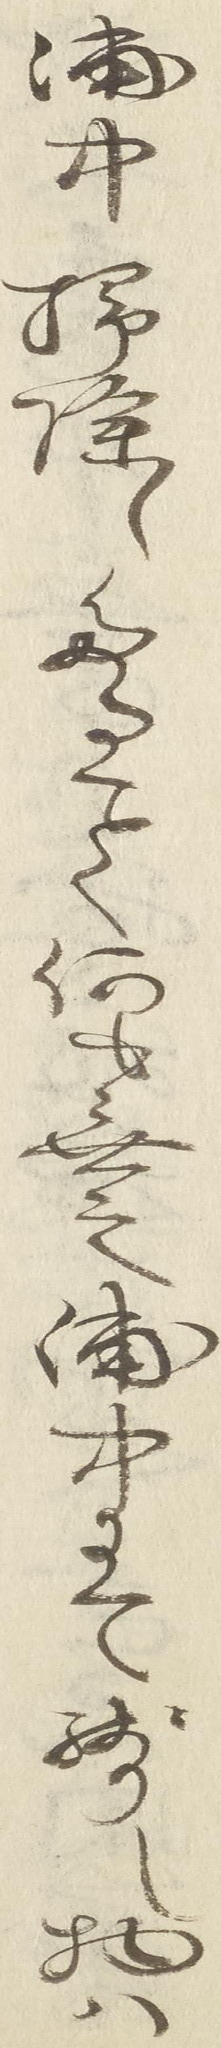浦中掃除したることく何も無之浦中にて残りし物は

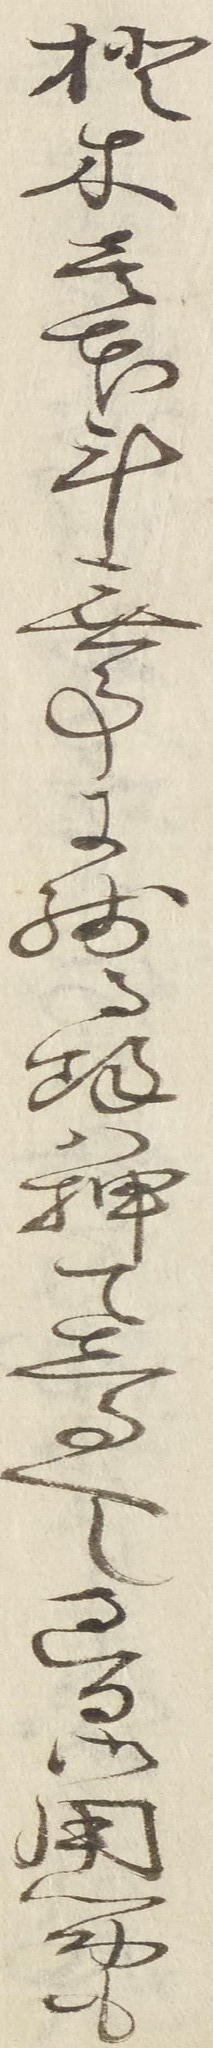橙来壱本斗無事に残る故は押てしるべし過日御用筋も
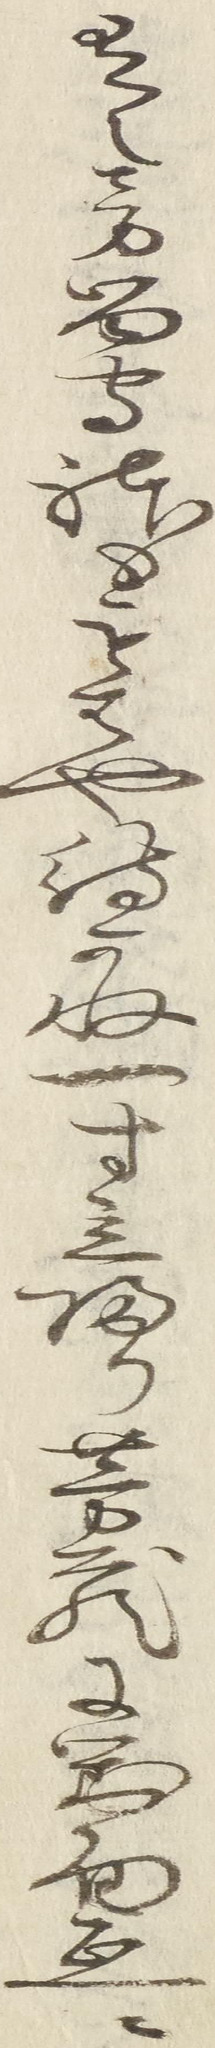有之旁留守躰もとはや待かね一寸立かえり芳蔵に対面互に
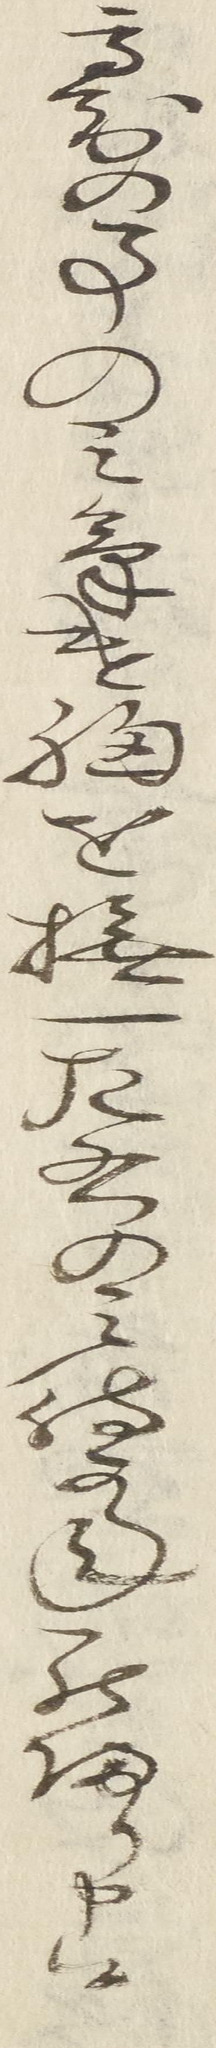高知の事のみ気遣胸を撫一左右のみ待かね罷帰り申候
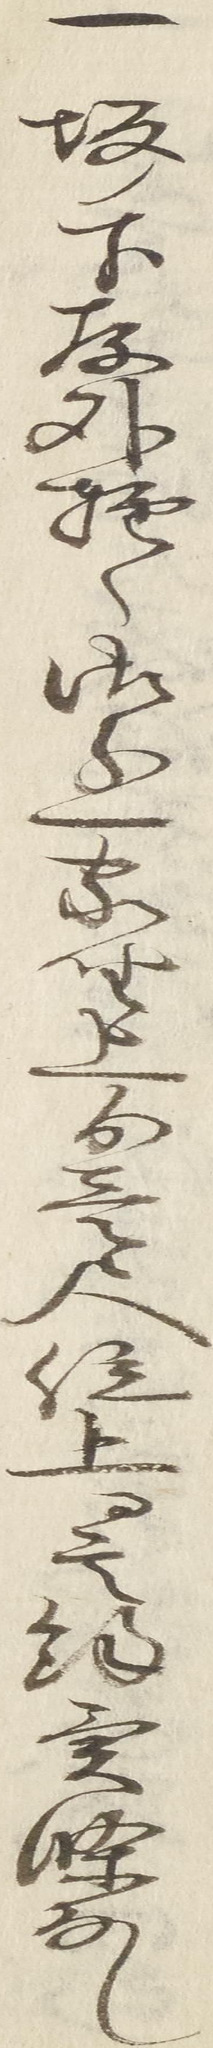一坂の下存外軽く御分一家座上ゟ壱尺位上る其餘異條なし
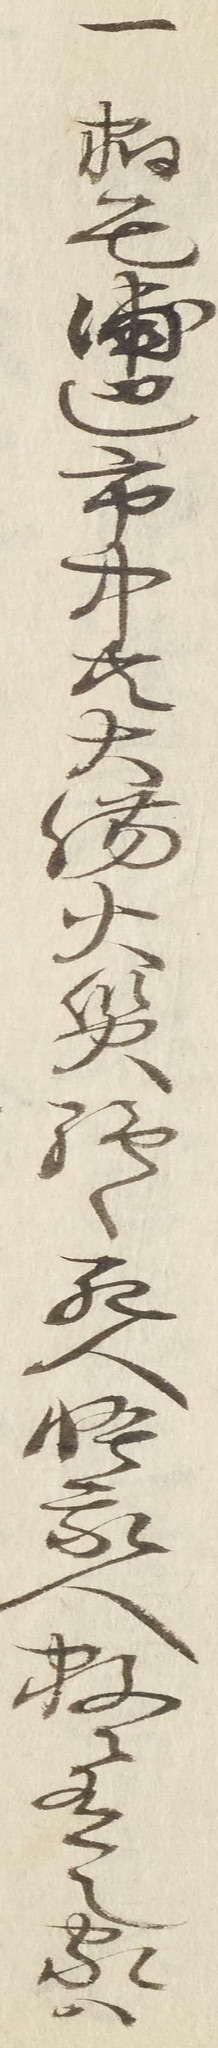一宿毛浦辺市中共大傷火災強く死人怪我人数々之家は
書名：地震記　下
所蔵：東京大学地震研究所図書室 Earthquake Research Institute Library, The University of Tokyo, JAPAN
